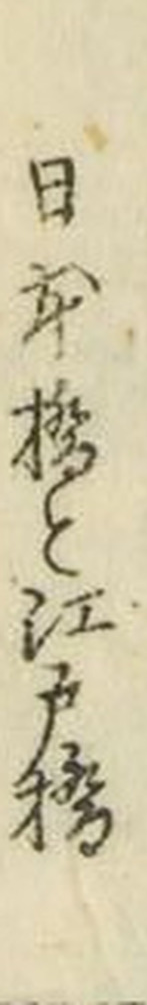日本橋と江戸橋
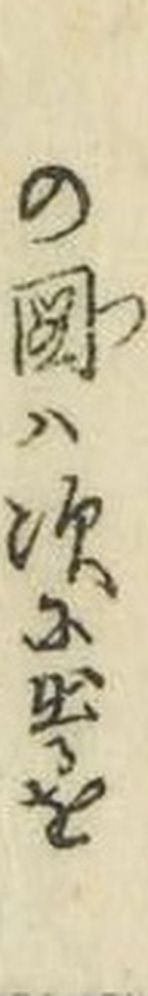の図は次に出るを
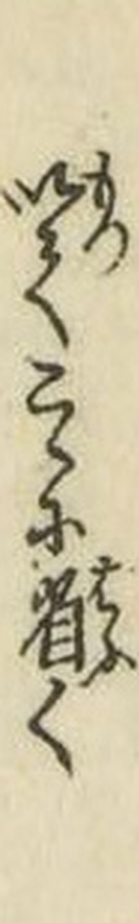以てこゝに省く

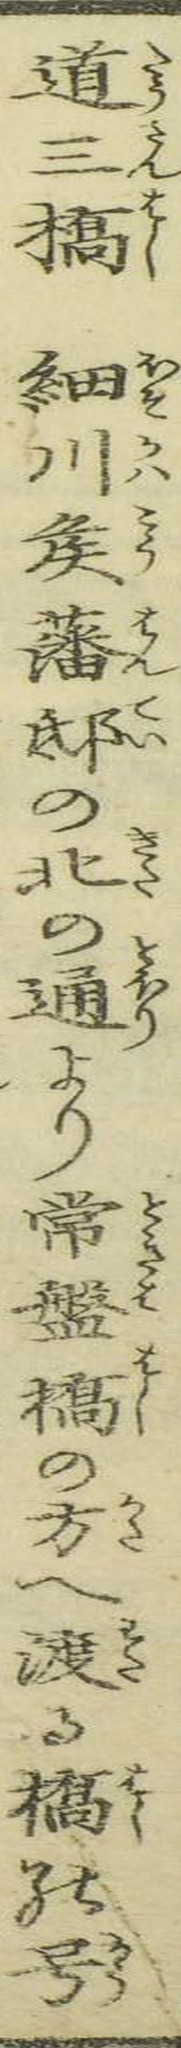道三橋細川侯藩邸の北の通より常盤橋の方へ渡る橋の号
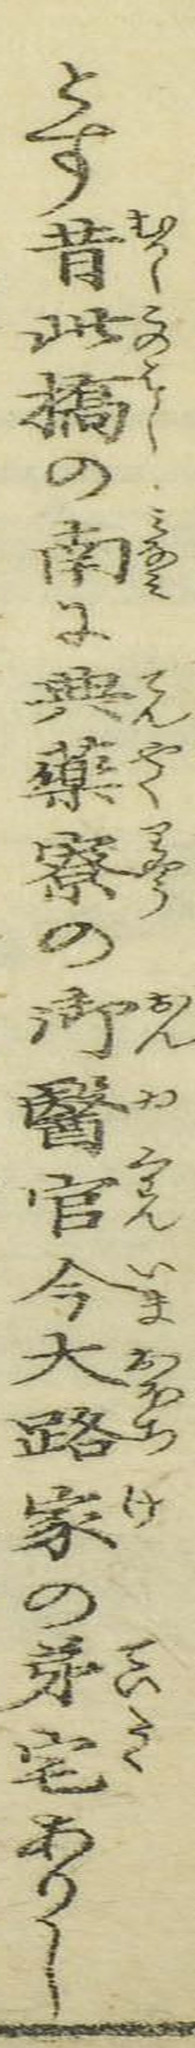とす昔此橋の南に典薬寮の御医官今大路家の弟宅ありし
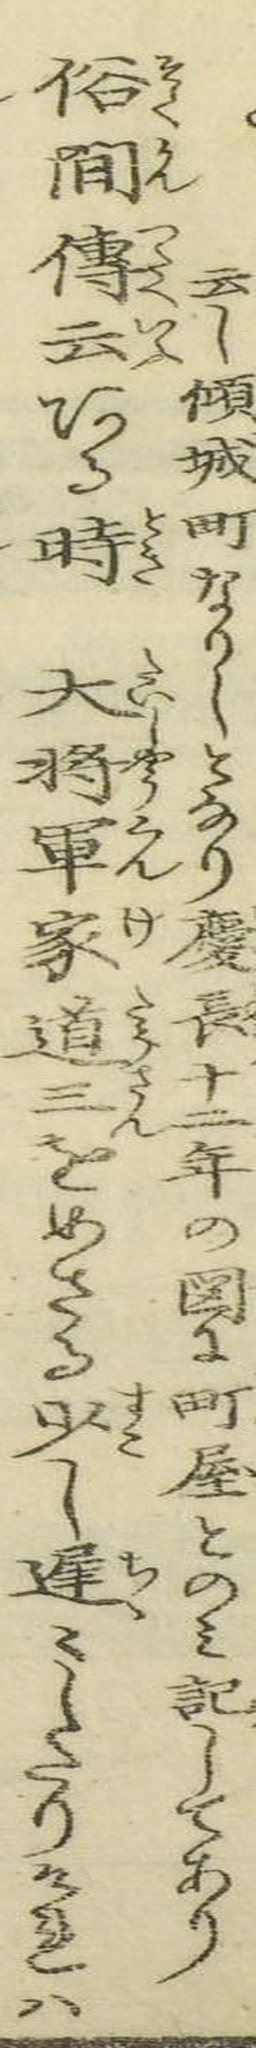俗間伝云ある時大将軍家道三をめさる少し遅〻したりけれは
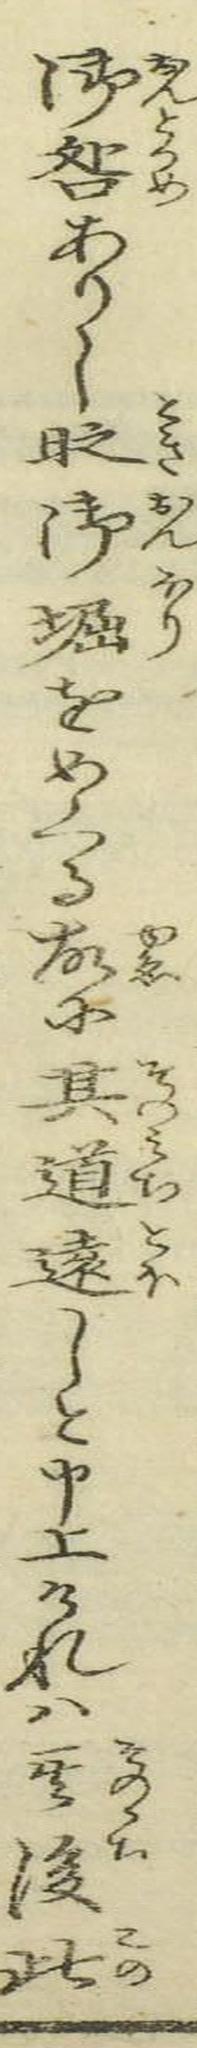御咎ありし時御堀をめくる故に其道遠しと申上けれは其後此
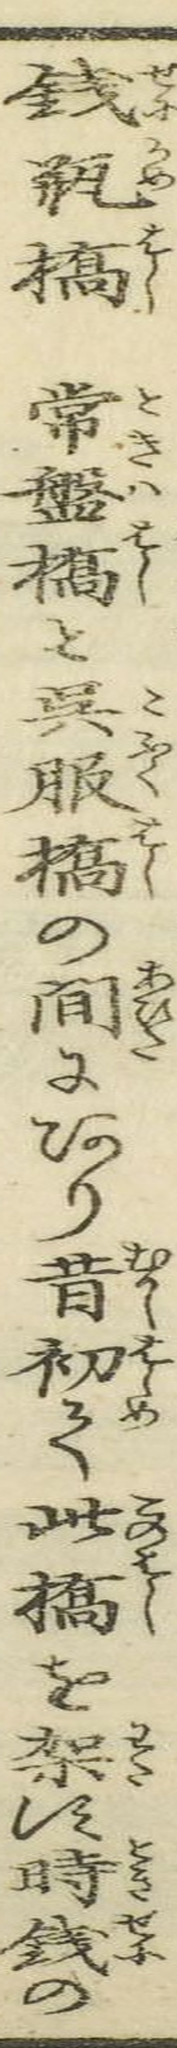銭瓶橋常盤橋と呉服橋の間にあり昔初て此橋を架す時銭の
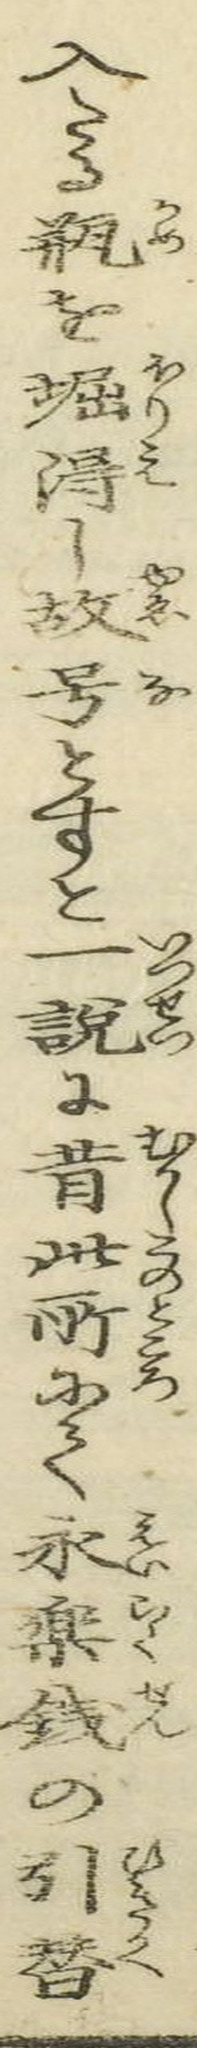入たる瓶を堀得し故号とすと一説に昔此所にて永楽銭の引替
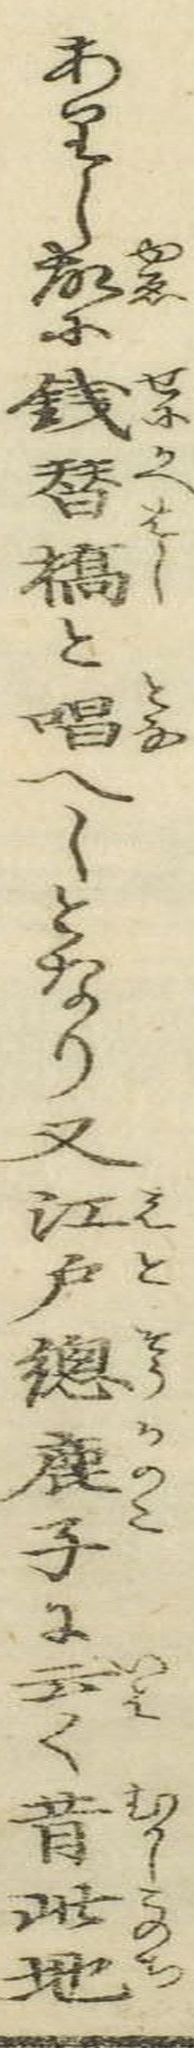ありし故に銭替橋と唱へしとなり又江戸総鹿子に云く昔此地
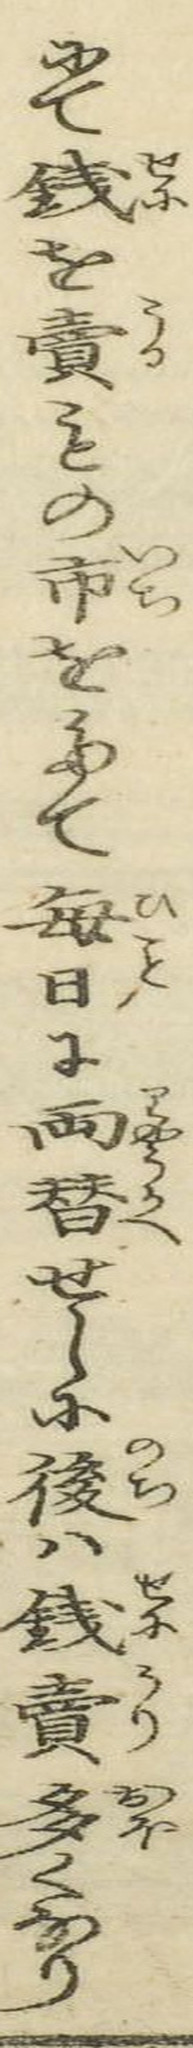にて銭を売ことの市をたて毎日に両替せしに後は銭売多くなり
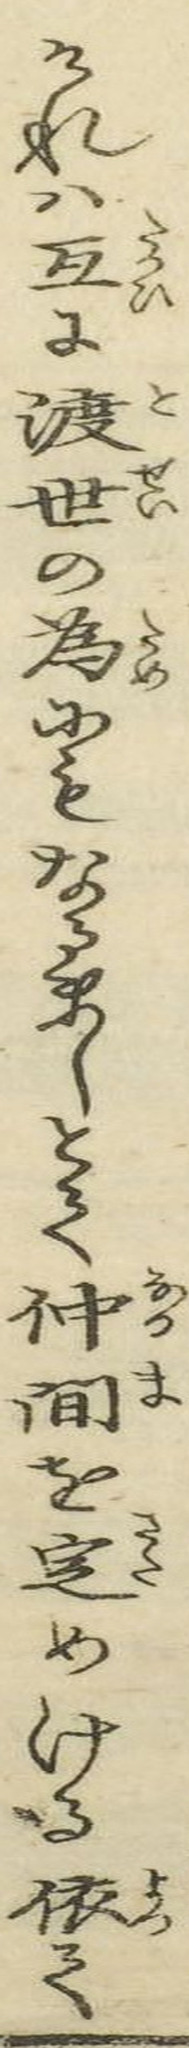けれは互に渡世の為にもなるましとて仲間を定めける依て
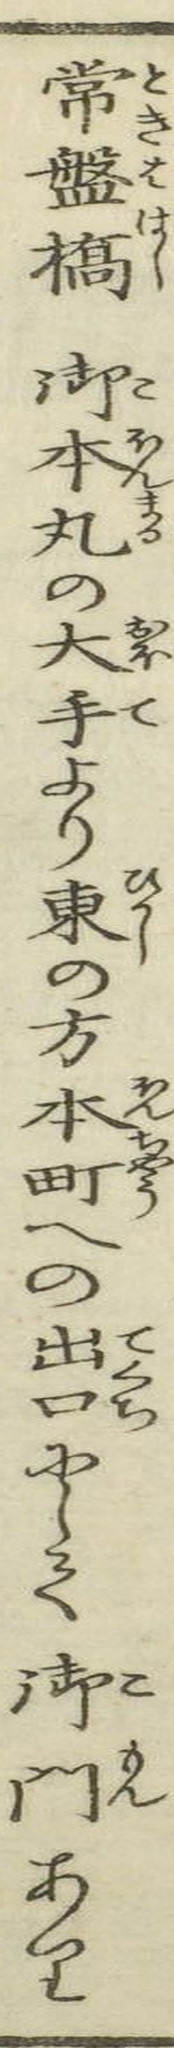常盤橋御本丸の大手より東の方本町への出口にして御門あり
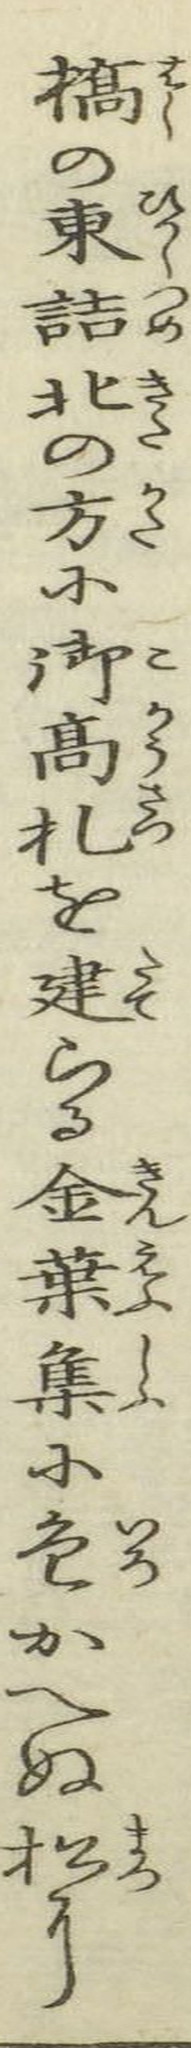橋の東詰北の方に御高札を建らる金葉集に色かへぬ松に
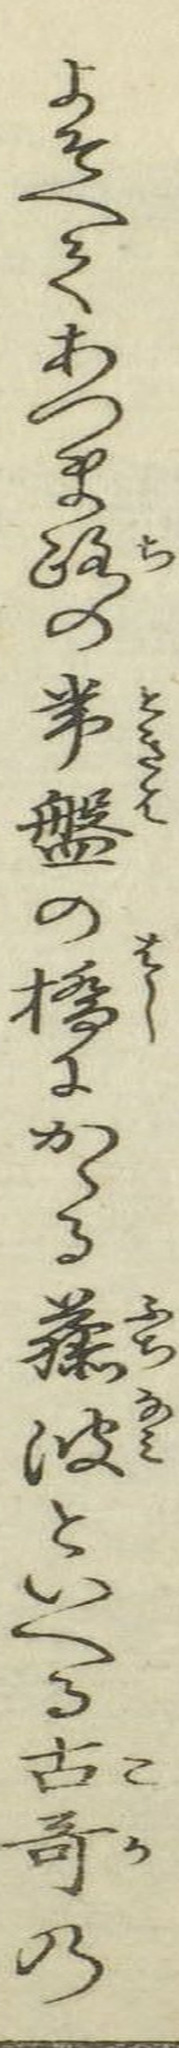よそへてあつま路の常盤の橋にかゝる藤波といへる古哥の
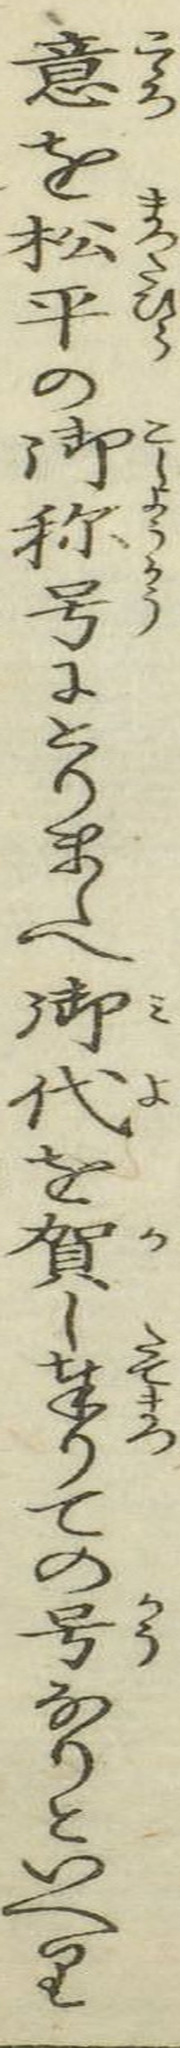意を松平の御称号にとりましへ御代を賀し奉りての号なりといへり
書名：江戸名所図会 20巻 巻之1
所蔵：東京学芸大学教育コンテンツアーカイブ
